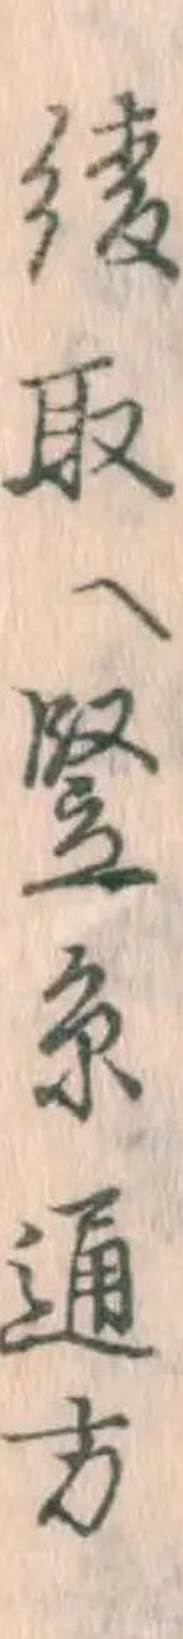綾取へ竪糸通方
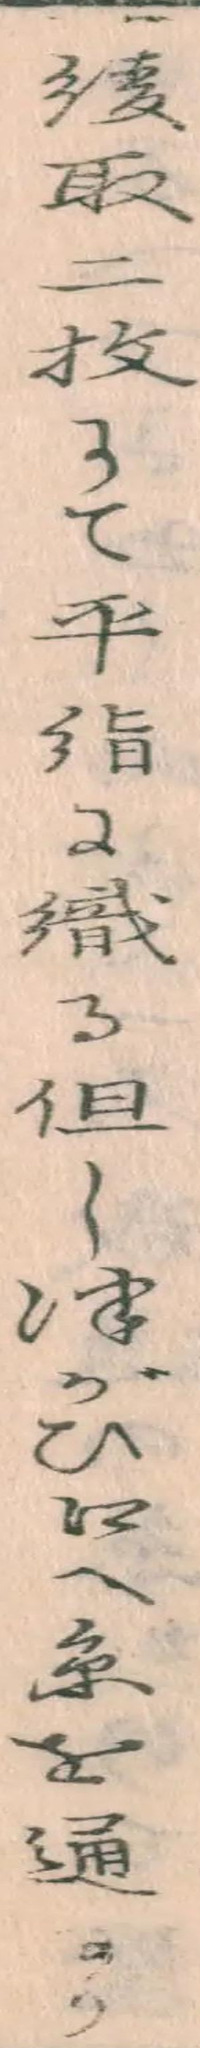一綾取二枚にて平𥿻に織る但しつがひ口へ糸を通なり
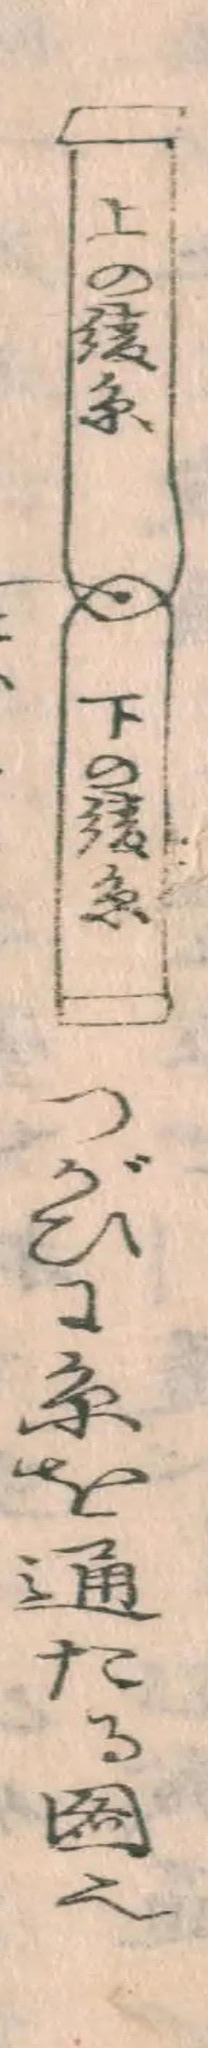上の綾糸下の綾糸つがひに糸を通たる図也
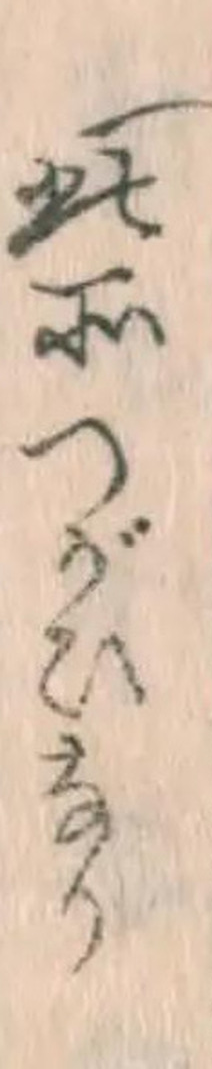此所つがひなり
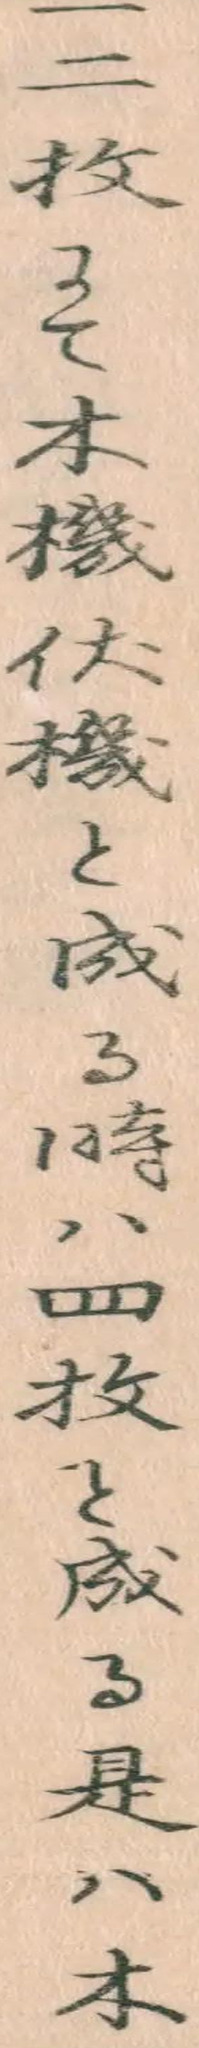一二枚にて木機伏機と成る時は四枚と成る是は木
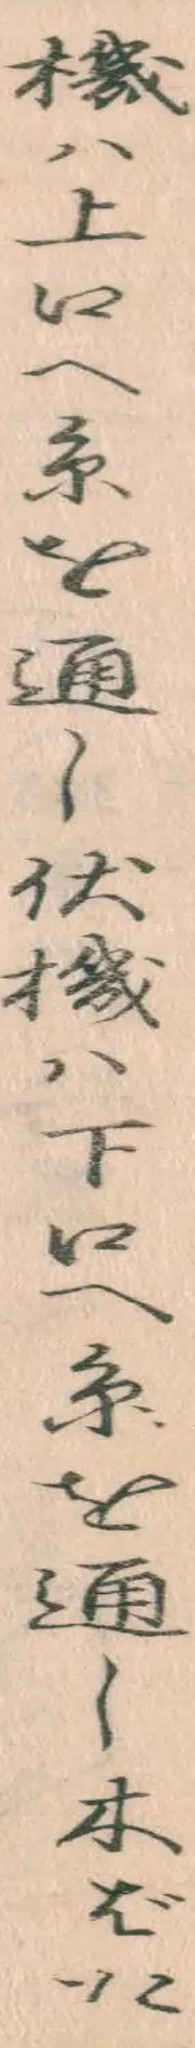機は上口へ糸を通し伏機は下口へ糸を通し木ばた
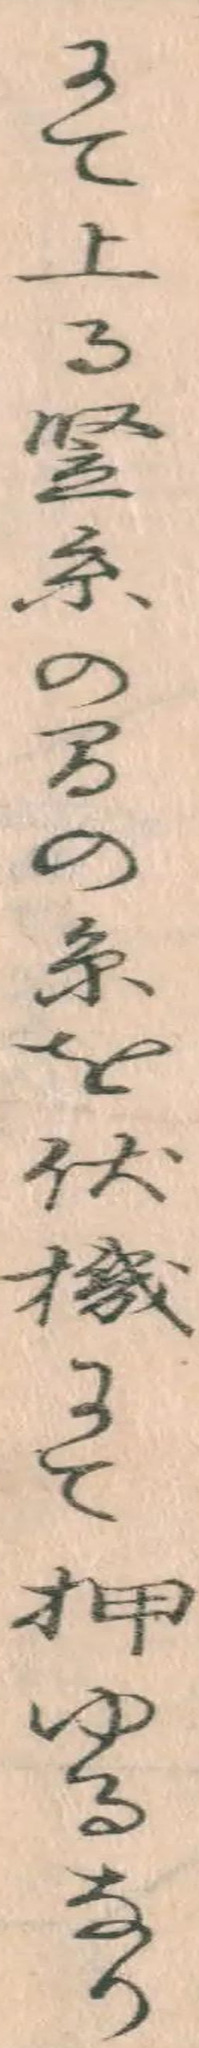にて上る竪糸の間の糸を伏機にて押ゆるなり
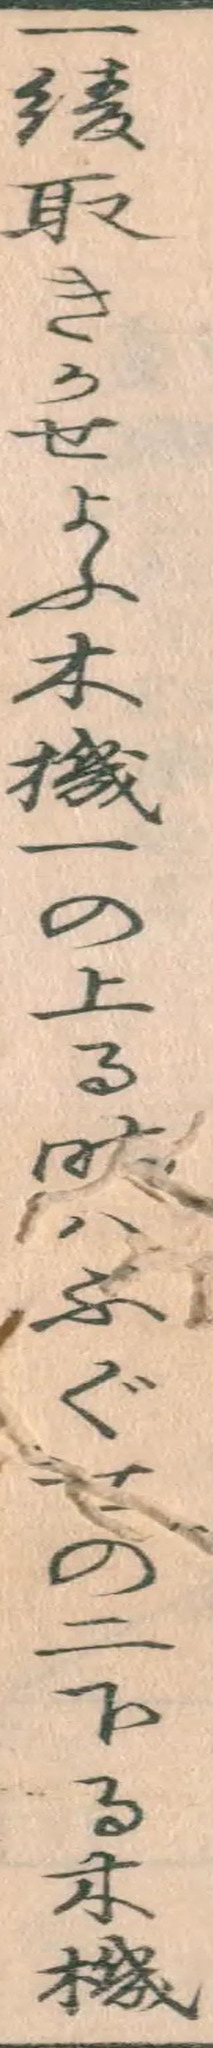一綾取きかせよふ木機一の上る時はふぐせの二下る木機
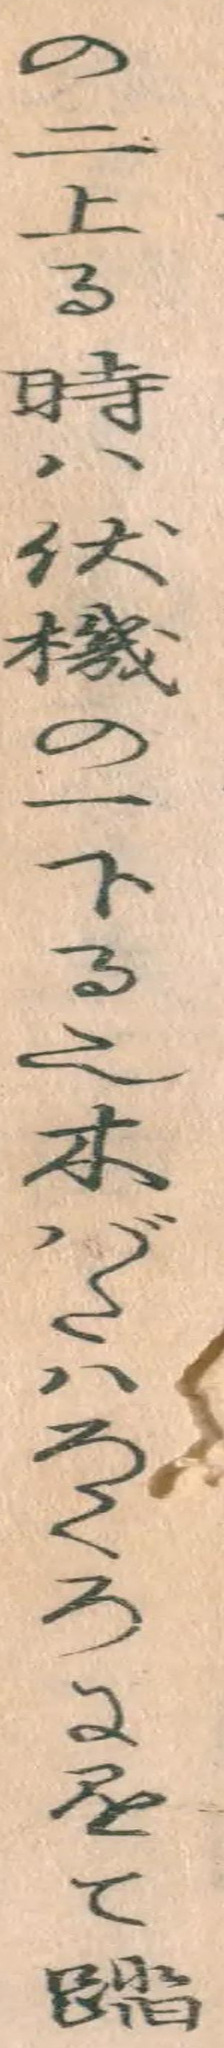の二上る時は伏機の一下る也木ばたはろくろに懸て蹈
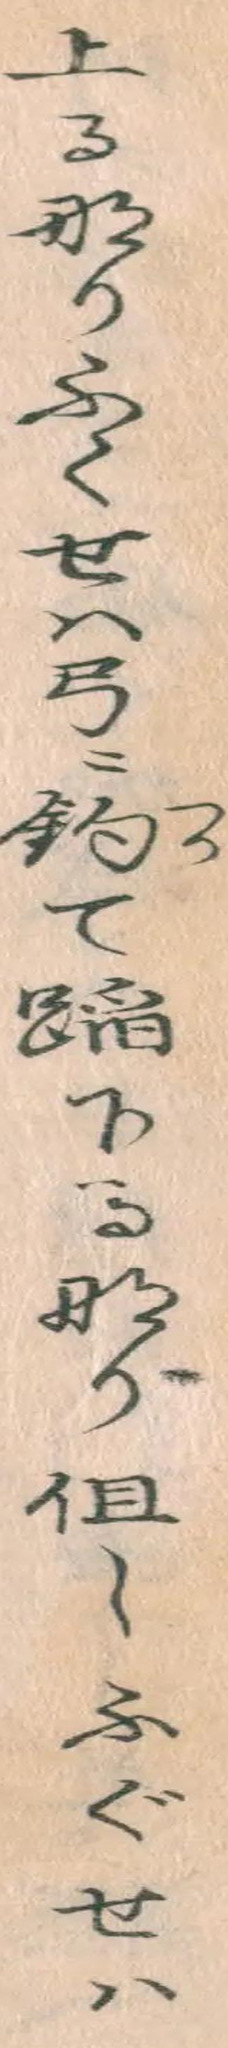上るなりふくせは弓に釣て蹈下るなり但しふぐせは
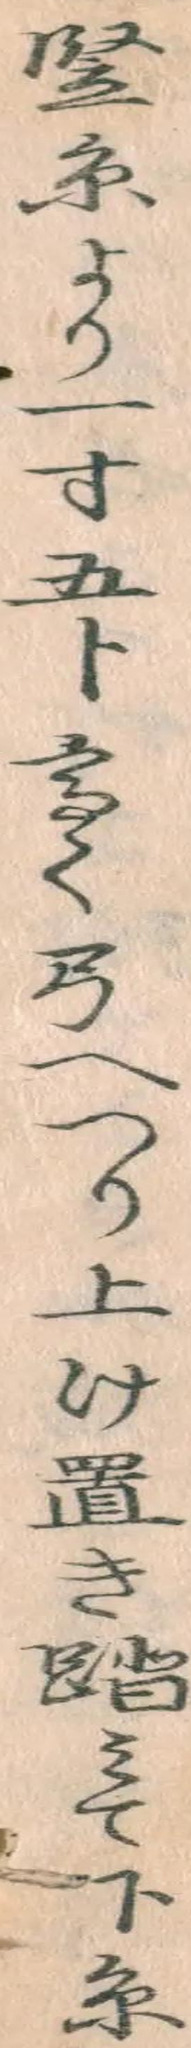竪糸より一寸五分高く弓へつり上け置き蹈みて下糸
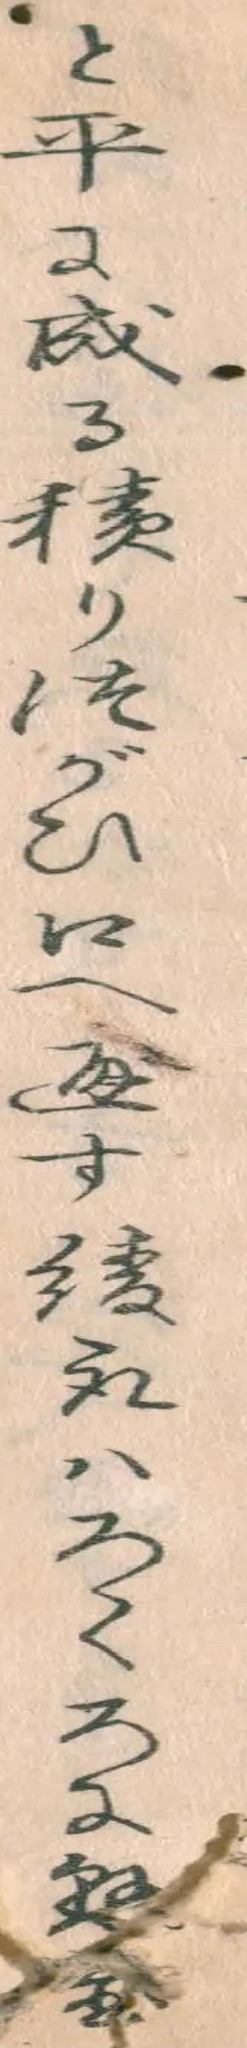と平に成る積りつがひ口へ通す綾取はろくろに懸置
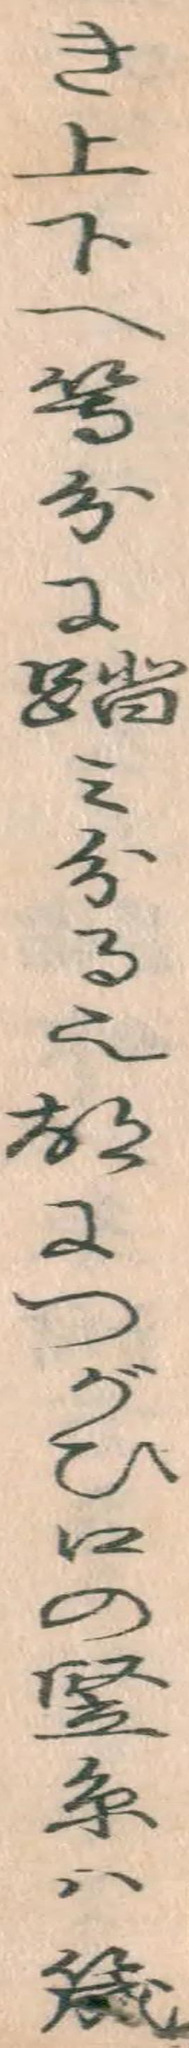き上下へ等分に蹈み分る也故につがひ口の竪糸は筬
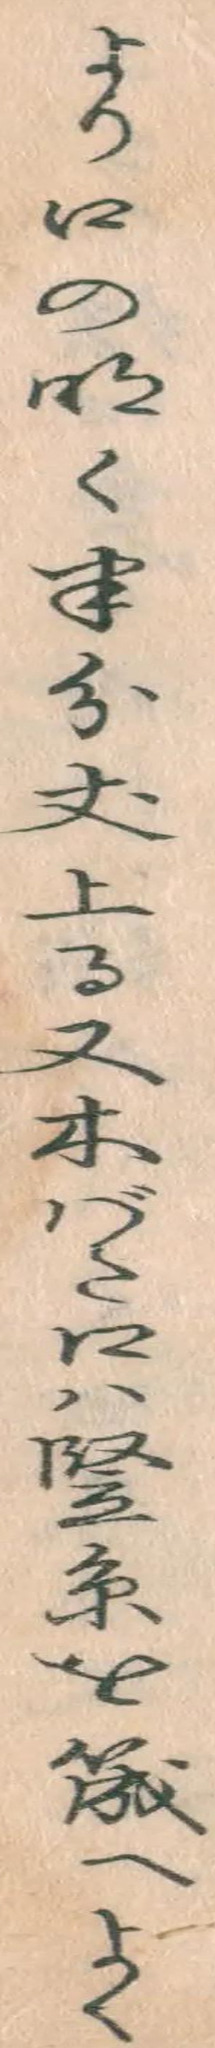より口の明く半分丈上る又木ばた口は竪糸を筬へよく
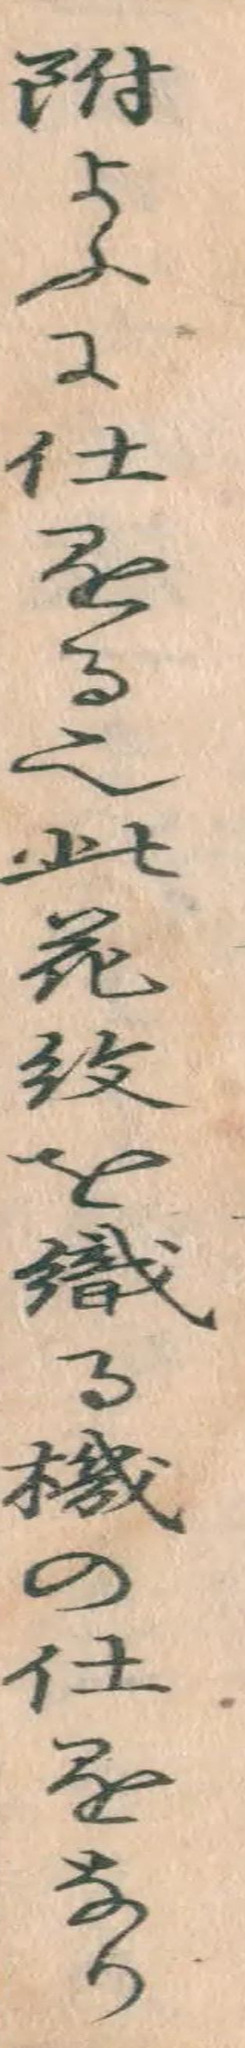附よふに仕懸る也此花紋を織る機の仕懸なり

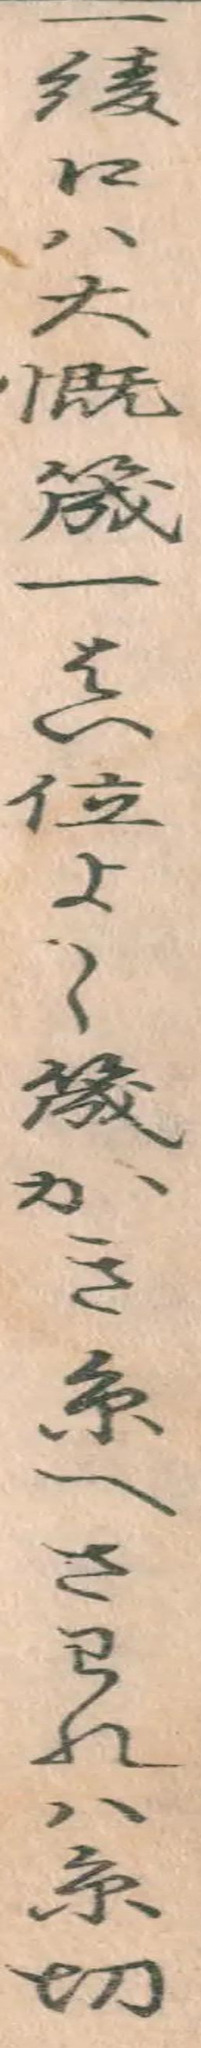一綾口は大慨筬一はい位よし筬かき糸へさわれは糸切
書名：機織彙編 5巻. [2]
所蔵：国立国会図書館 National Diet Library, JAPAN
